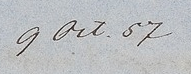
9 Oct. 57
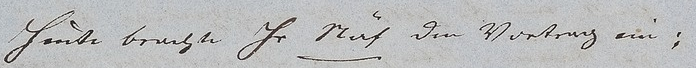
Heute brachte Hr Näf den Vortrag ein:
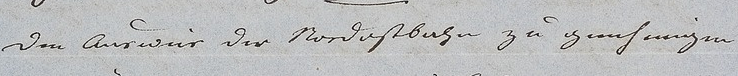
den Ausweis der Nordostbahn zu genehmigen
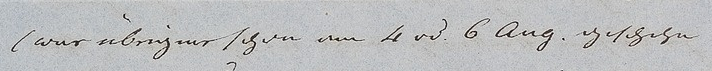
(was übrigens schon am 4 od. 6 Aug. geschehn
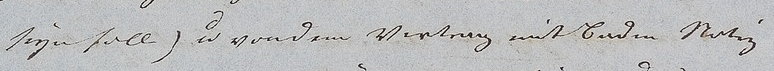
seyn soll) u von dem Vertrag mit Baden Notiz
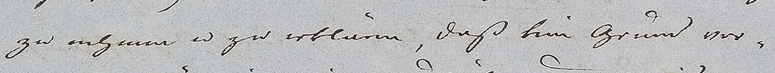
zu nehmen u zu erklären, dass kein Grund vor-
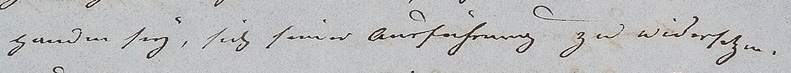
handen sey, sich seiner Ausführung zu widersetzen.
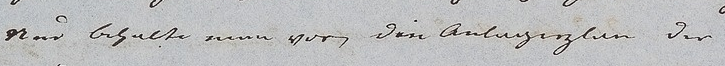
Nur behalte man vor, den Anlageplan der
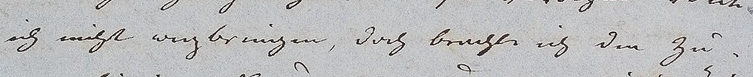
ich nicht wegbringen, doch brachte ich den Zu-
